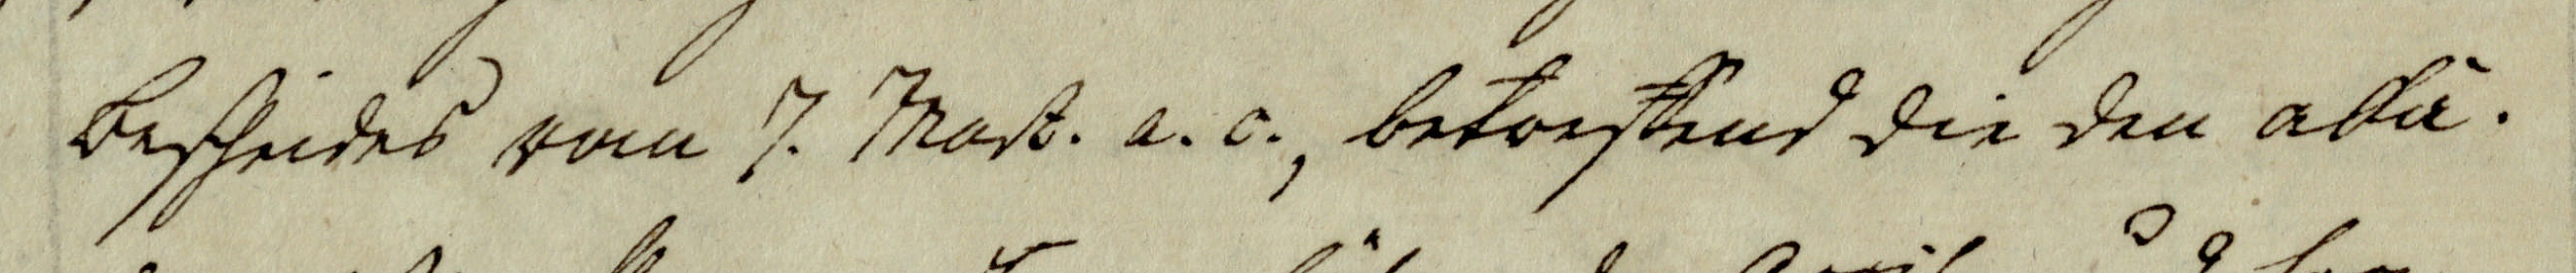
Bescheides vom 7. Mart. a. c., betreffend die den aka¬
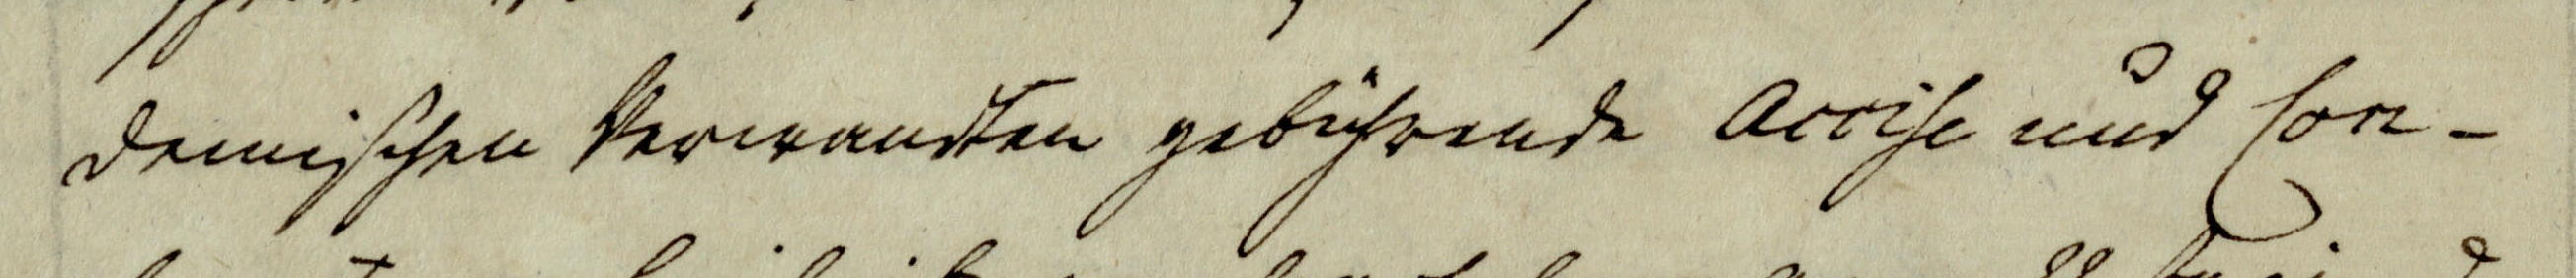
demischen Verwandten gebührende Accise und Con¬
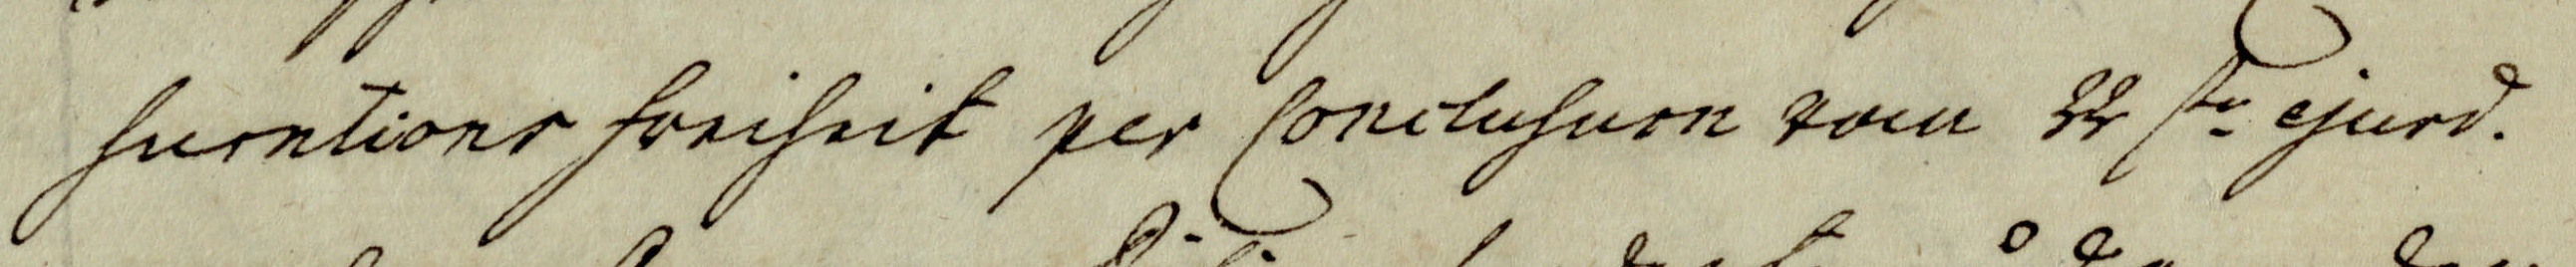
sumtionsfreiheit per Conclusum vom 22 st ejusd.
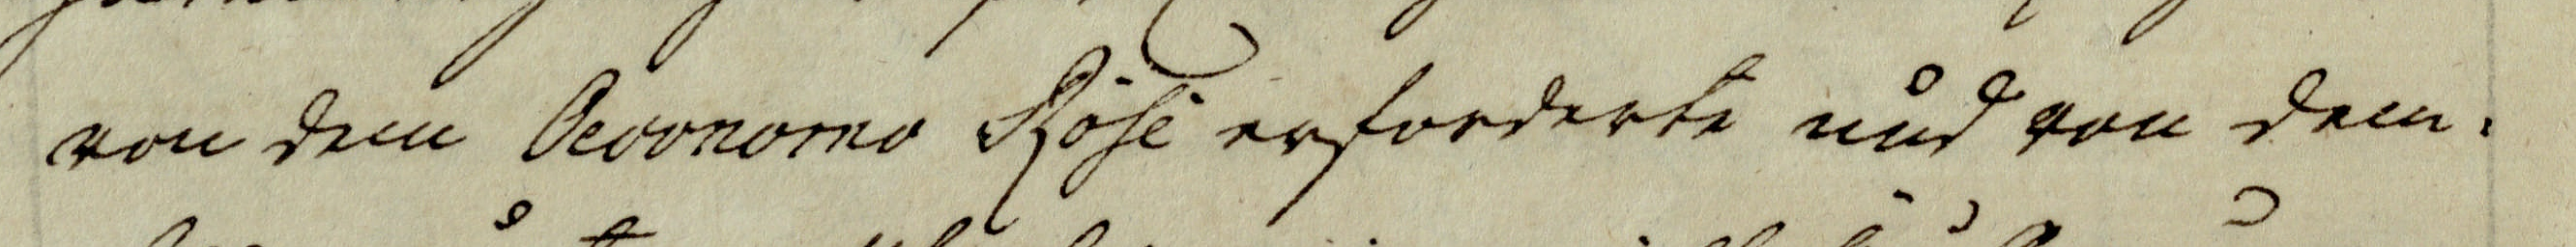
von dem Oeconomo Röse erforderte und von dem¬
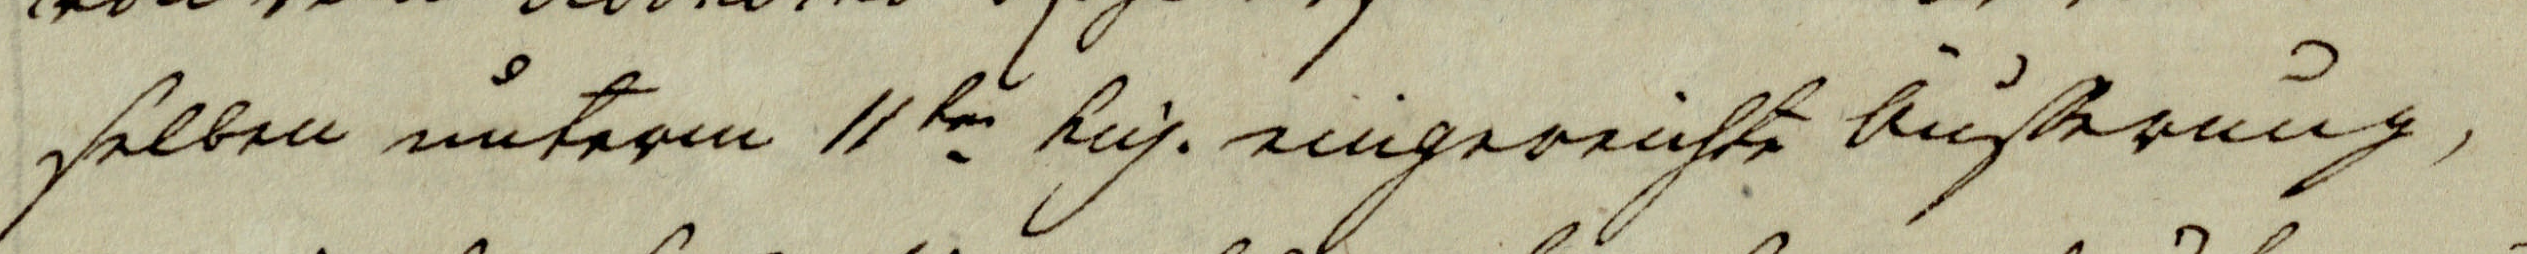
selben unterm 11 ten huj. eingereichte Äusserung,
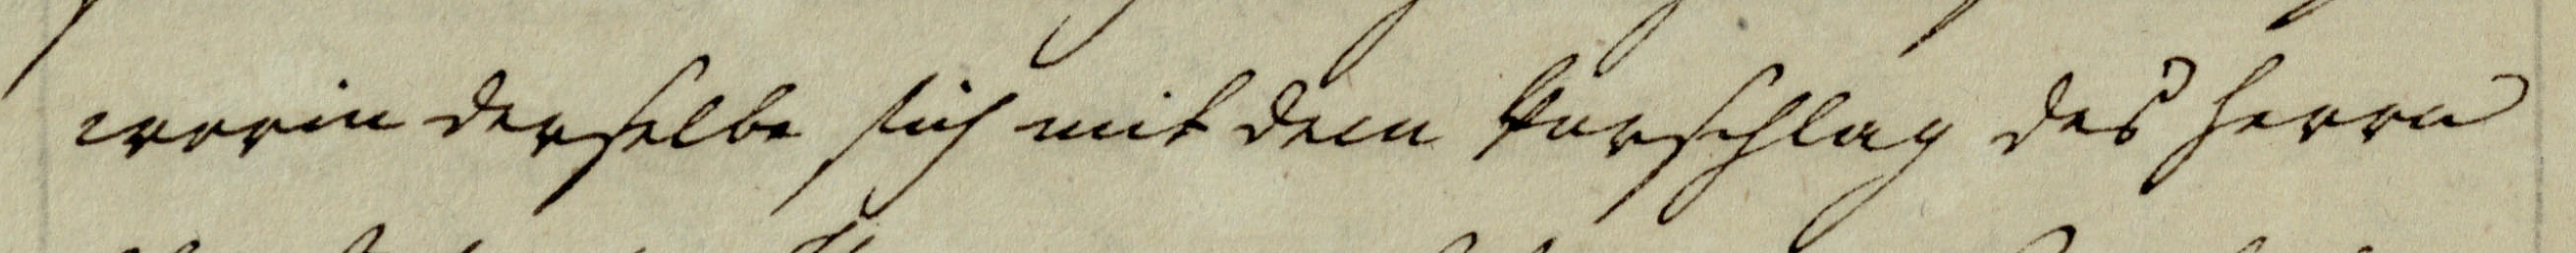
worin derselbe sich mit dem Vorschlag des Herrn
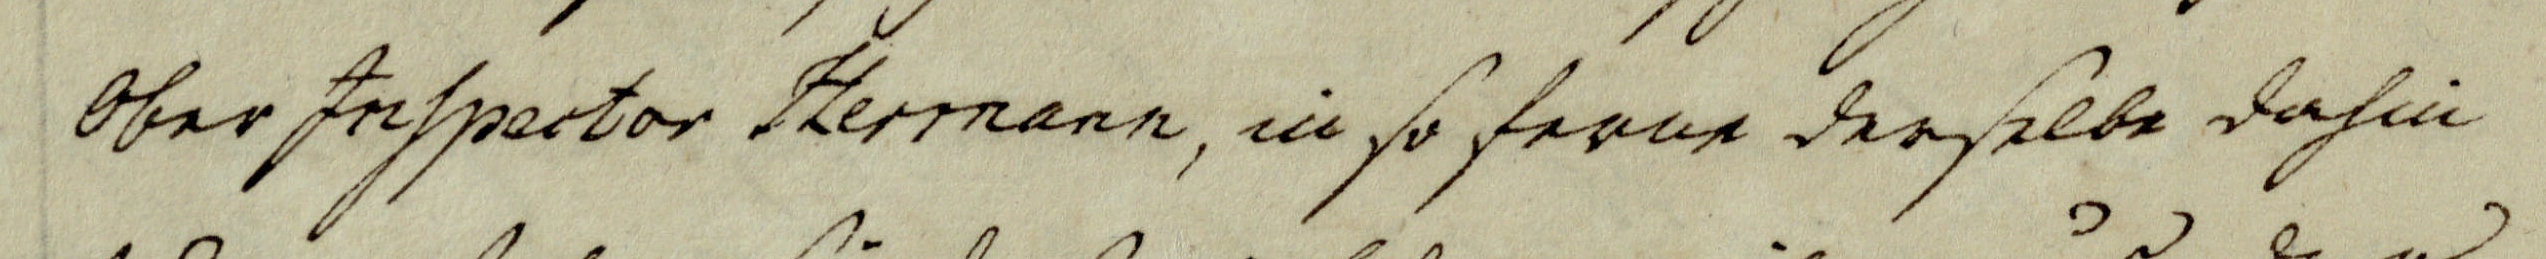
Ober Inspector Hermann, in so ferne derselbe dahin
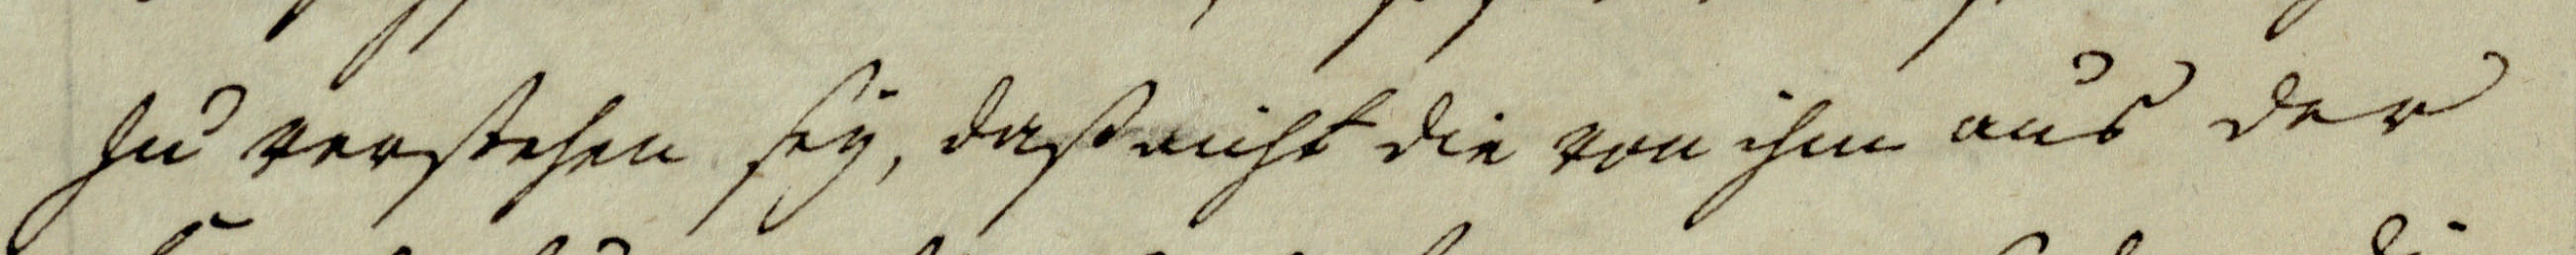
zu verstehen seÿ, daß nicht die von ihm aus der
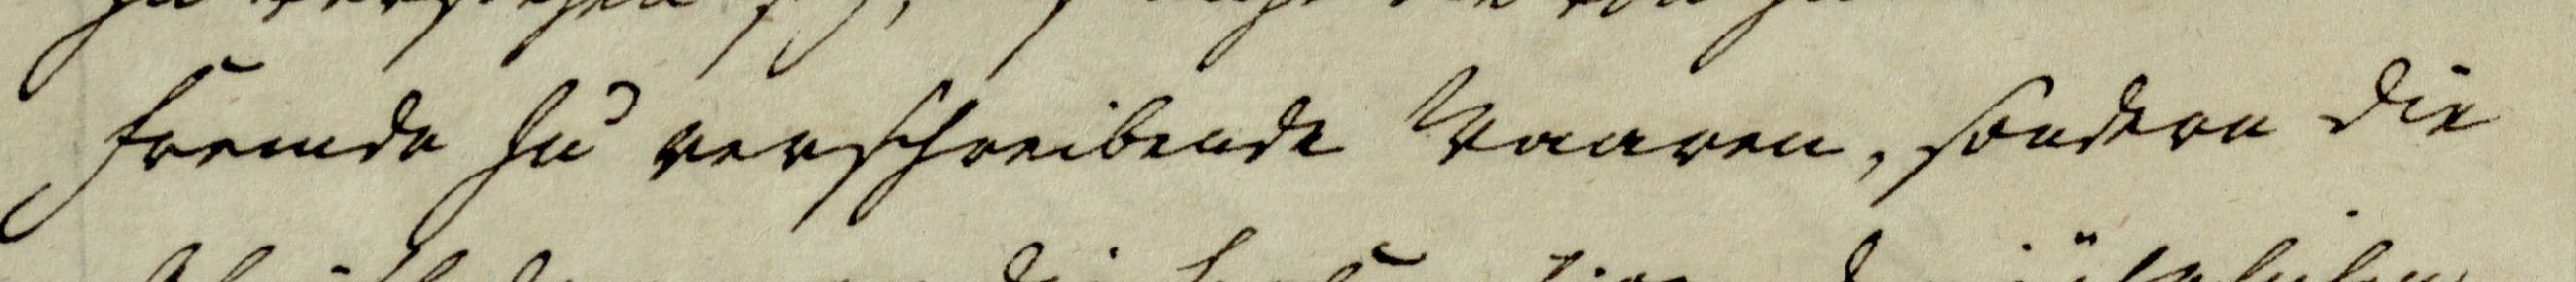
Fremde zu verschreibende Waaren, sondern die
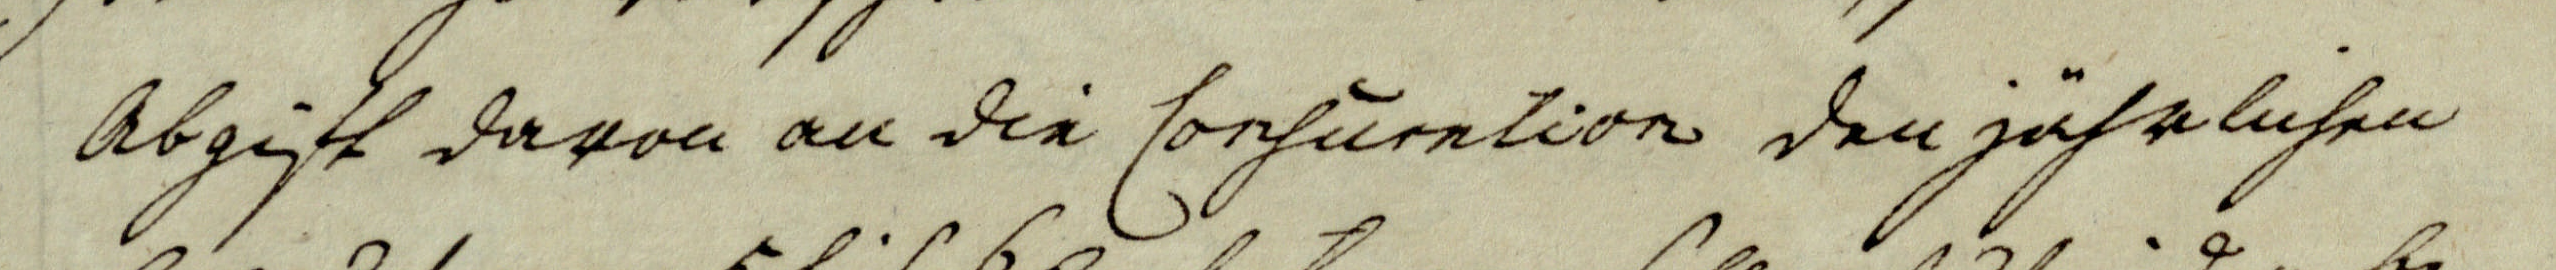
Abgift davon an die Consumtion den jährlichen
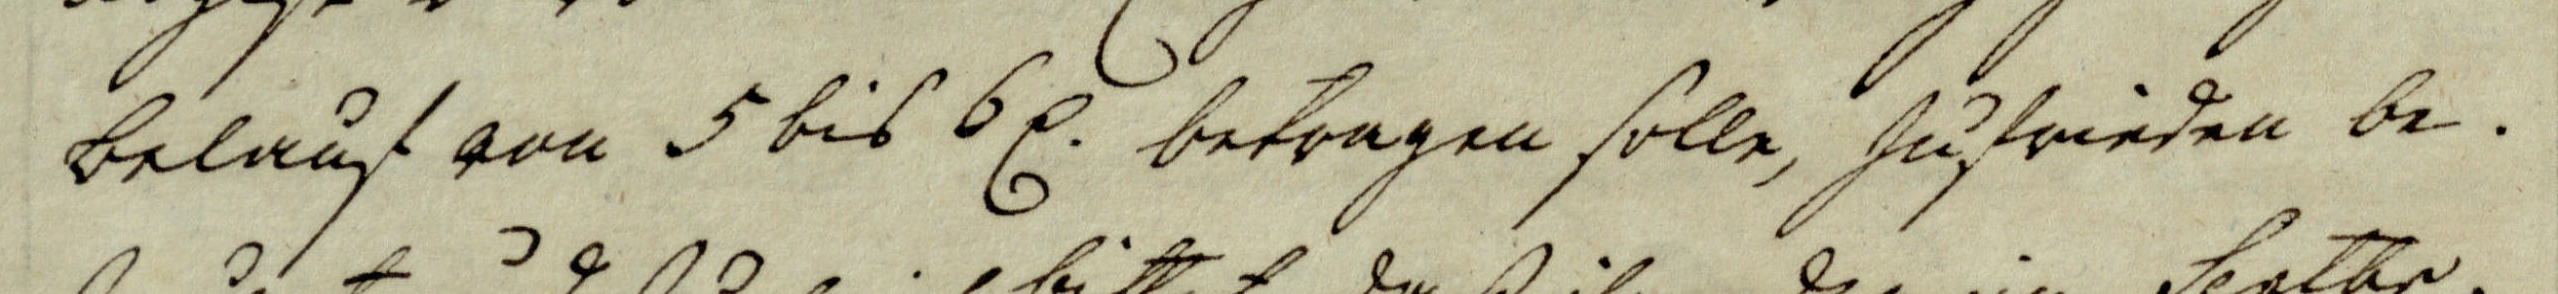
Belauf von 5 bis 6 l. betragen solle, zufrieden be¬
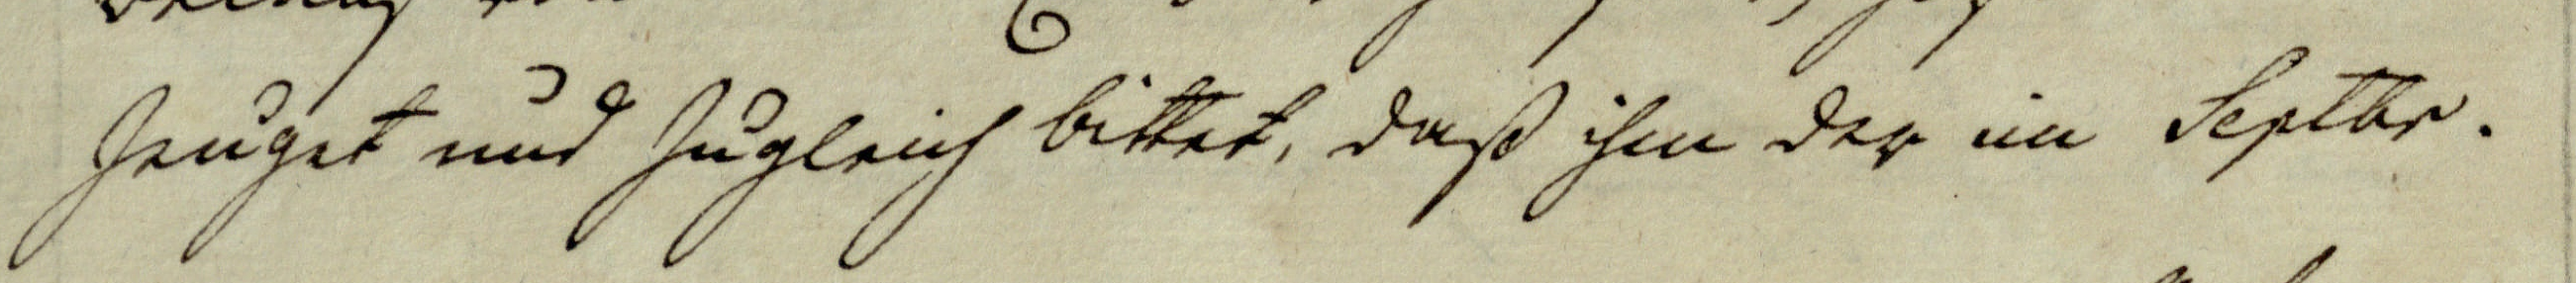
zeuget und zugleich bittet, daß ihm der im Septbr.
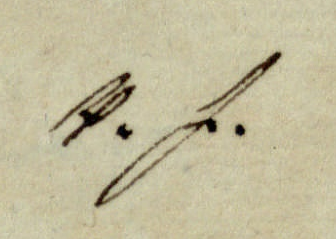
v. J.
